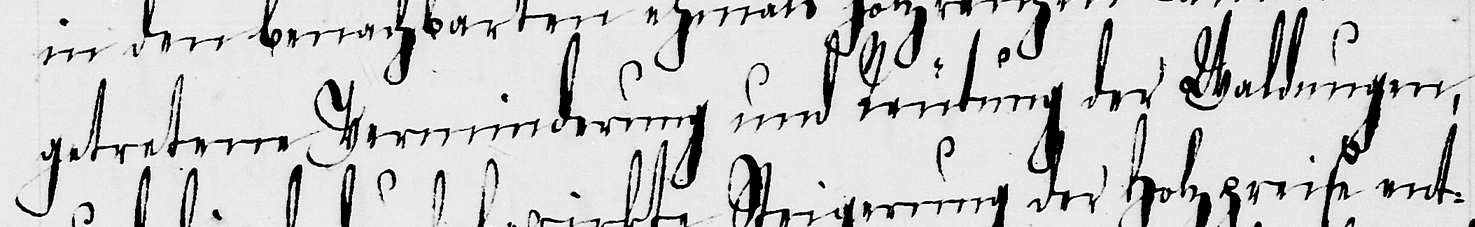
getretene Verminderung und Reutung der Waldungen,
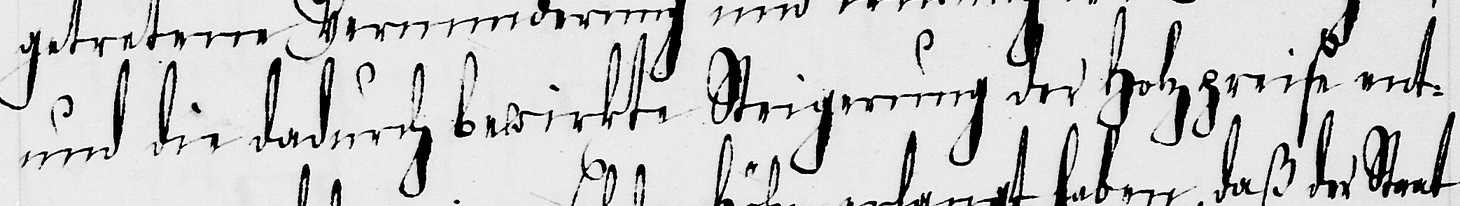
und die dadurch bewirkte Steigerung der Holzpreise ent¬
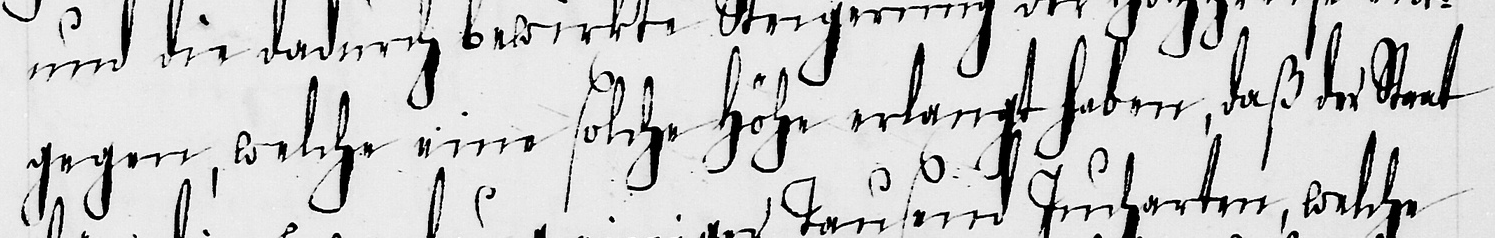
gegen, welche eine solche Höhe erlangt haben, daß der Sta¬
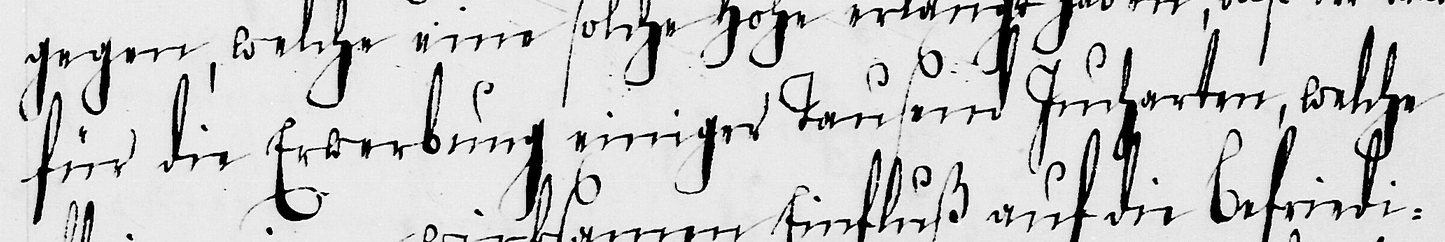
für die Erwerbung einiger Tausend Jucharten, welche
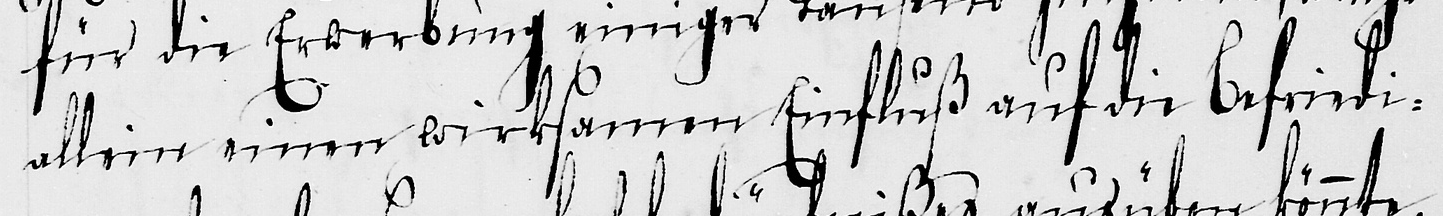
allein einen wirksamen Einfluß auf die Befriedi¬
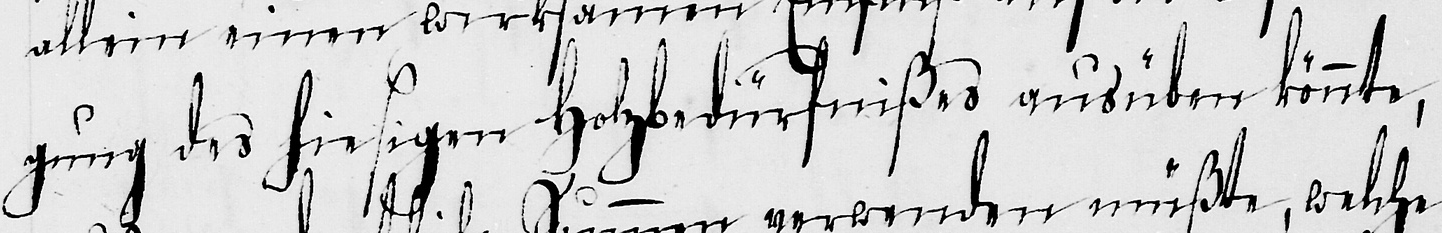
gung des hiesigen Holzbedürfnißes ausüben könnte,
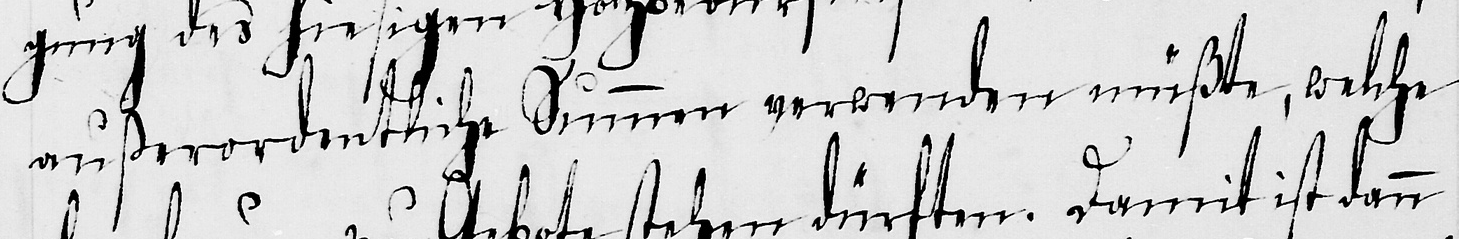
außerordentliche Summen verwenden müßte, welche
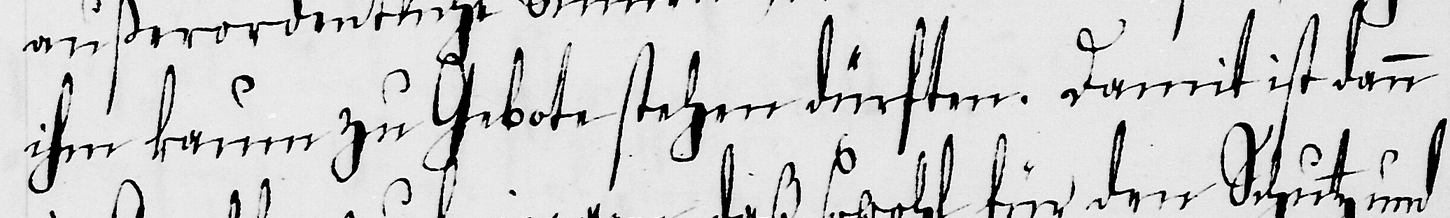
ihm kaum zu Gebote stehen dürften. Damit ist dann
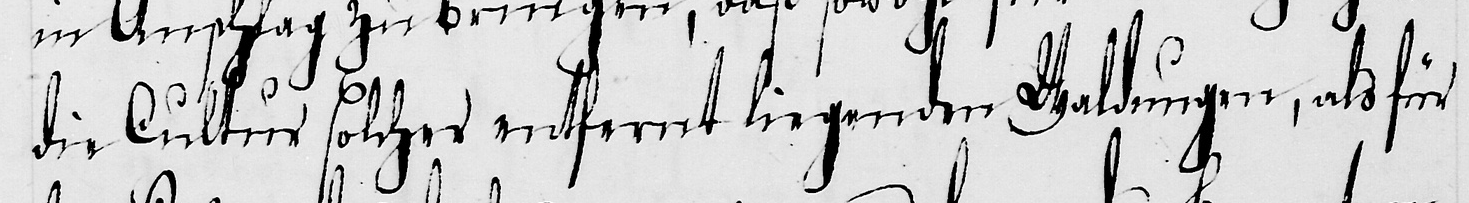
die Cultur solcher entfernt liegenden Waldungen, als für
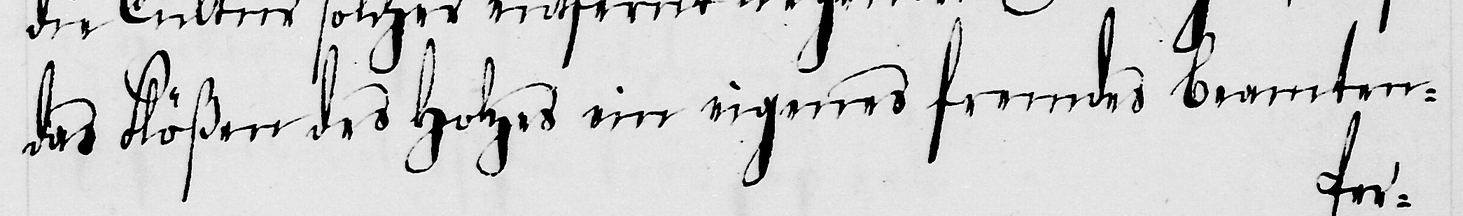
das Flößen des Holzes ein eigenes fremdes Beamten-
